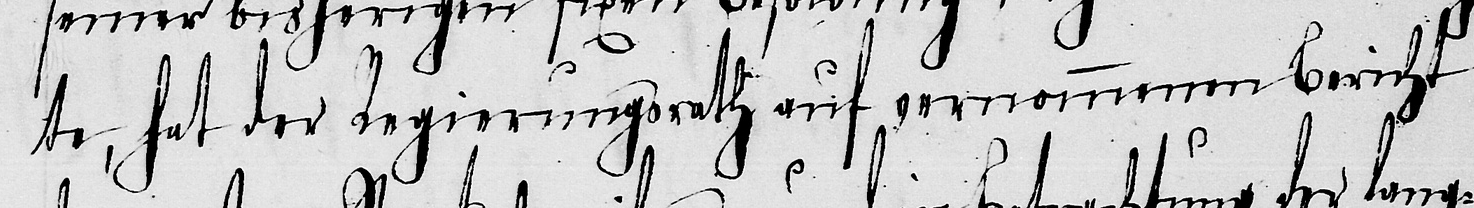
te, hat der Regierungsrath auf vernommenen Bericht
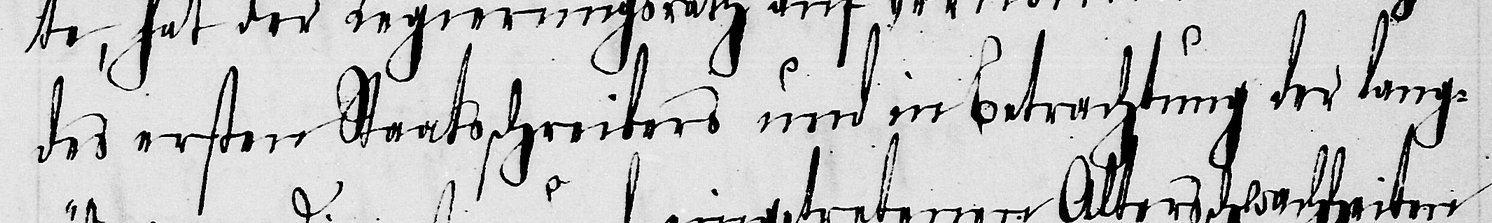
des ersten Staatsschreibers und in Betrachtung der lang¬
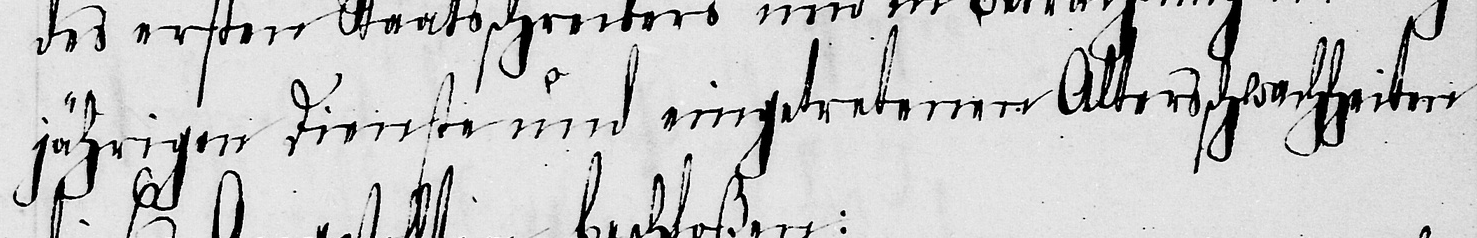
jährigen Dienste und eingetretenen Alterschwachheiten
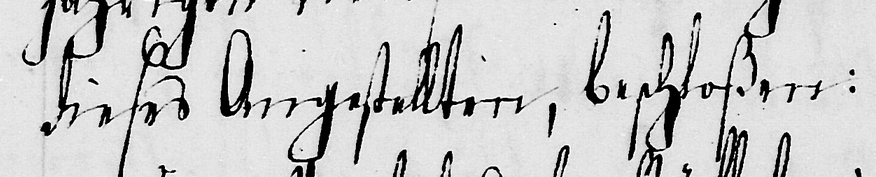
dieses Angestellen, beschloßen:
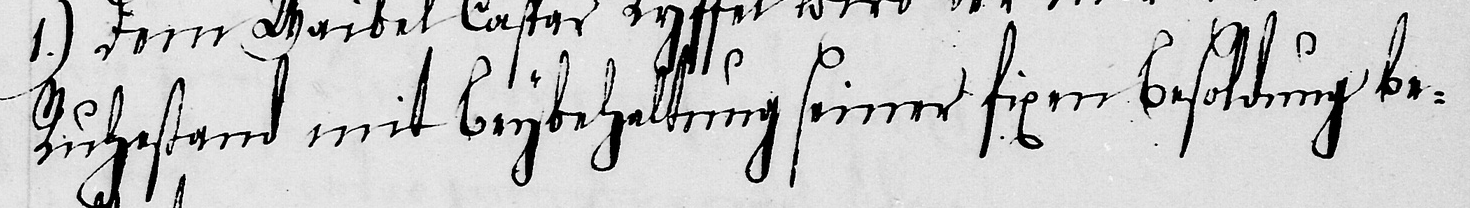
Ruhestand mit Beybehaltung seiner fixen Besoldung be¬
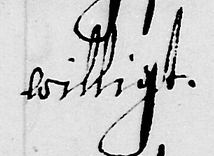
willigt.
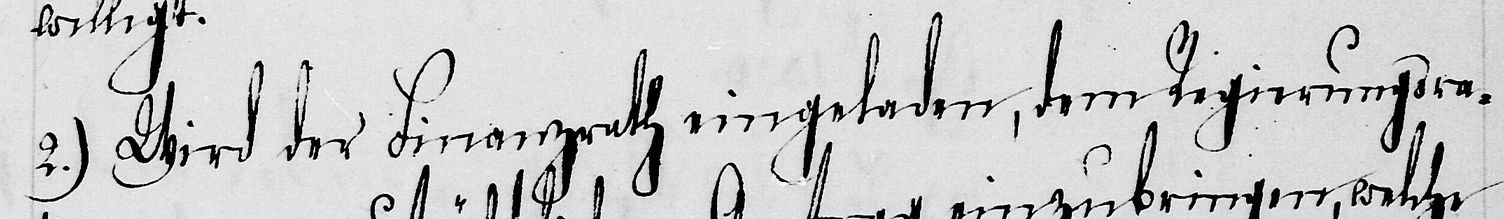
2.) Wird der Finanzrath eingeladen, dem Regierungsra¬
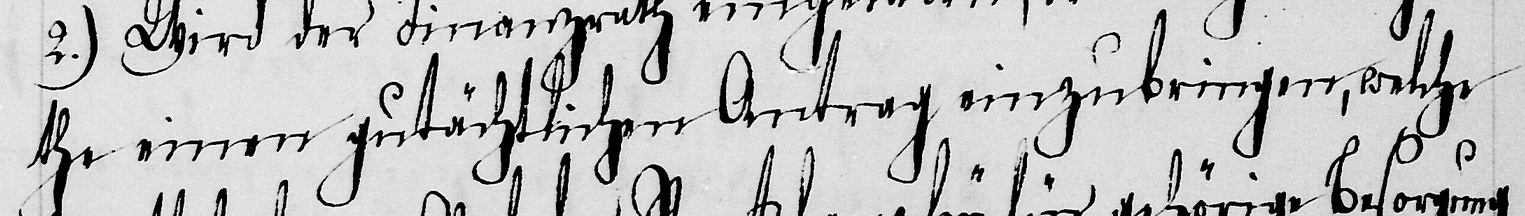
the einen gutächtlichen Antrag einzubringen, welche
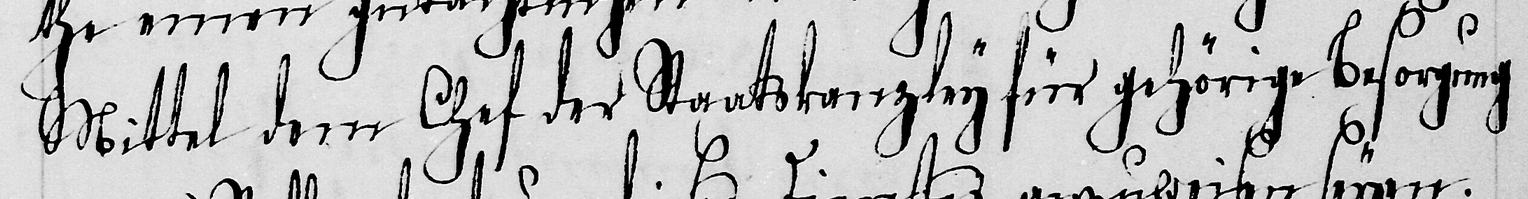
Mittel dem Chef der Staatskanzley für gehörige Besorgung
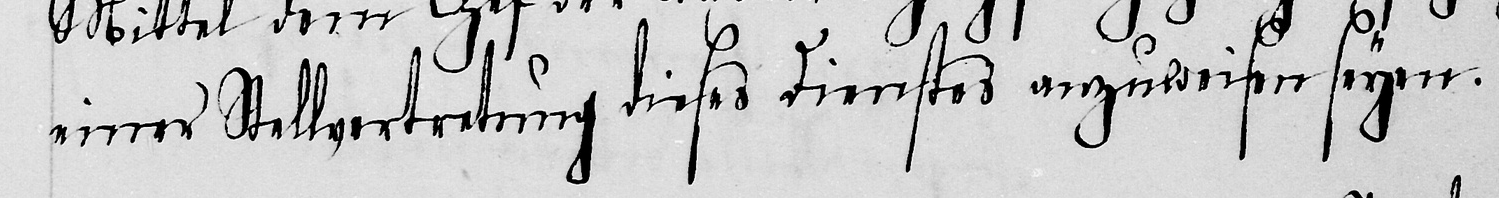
einer Stellvertretung dieses Dienstes anzuweisen seyen.
